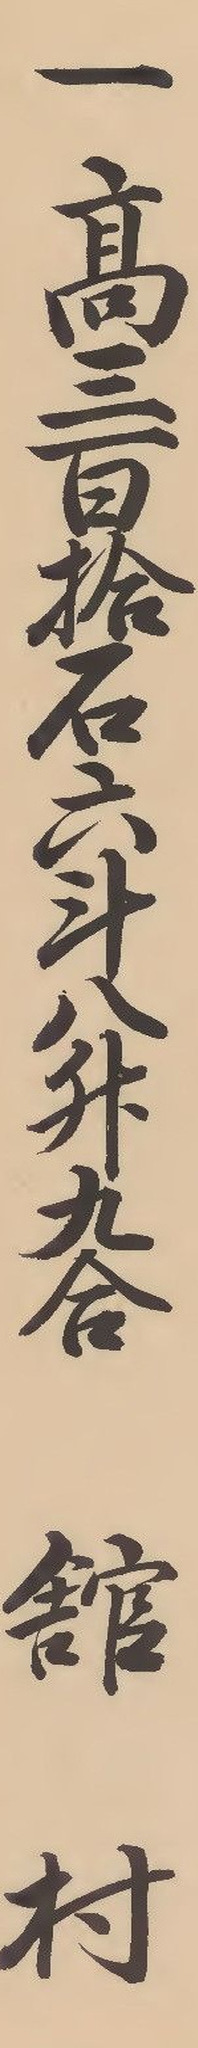一高三百拾石六斗八升九合館村

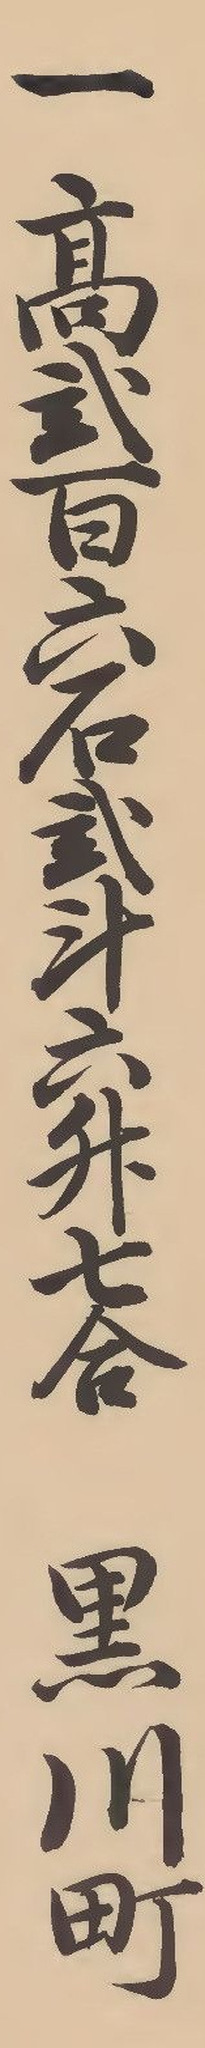一高弐百六石弐斗六升七合黒川町
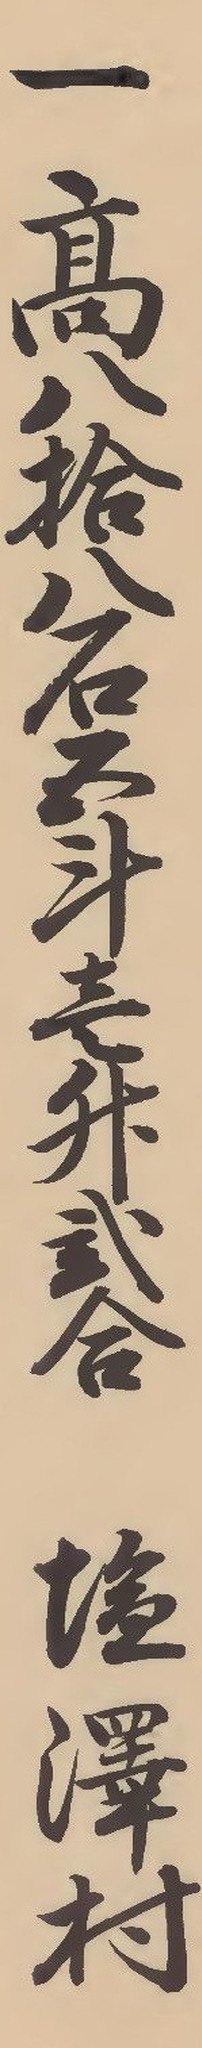一高八拾八石五斗壱升弐合塩沢村
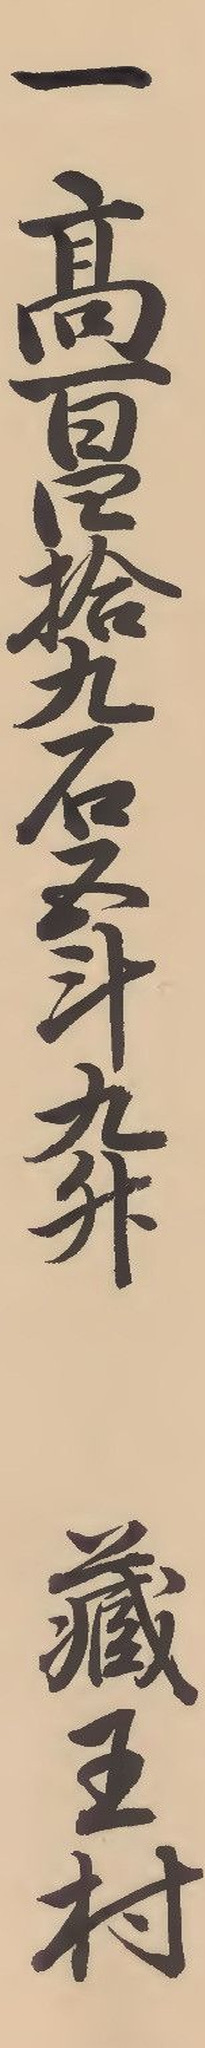一高百四拾九石五斗九升蔵王村
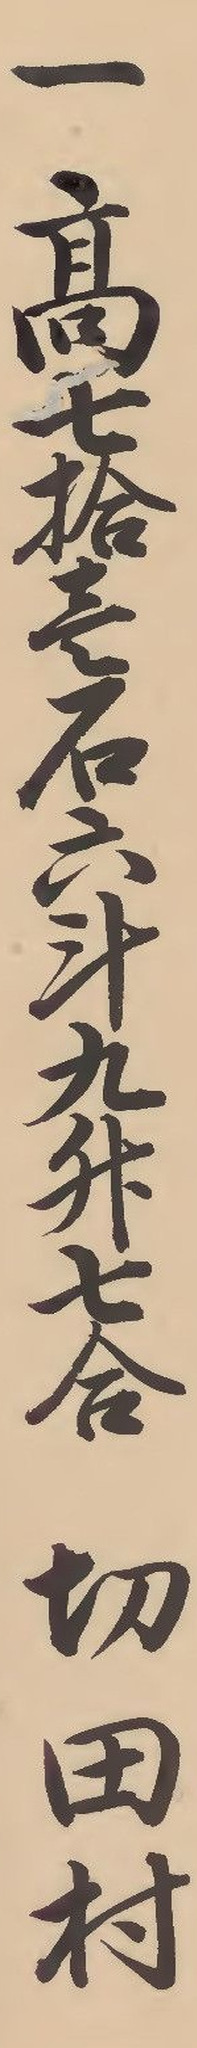一高七拾壱石六斗九升七合切田村
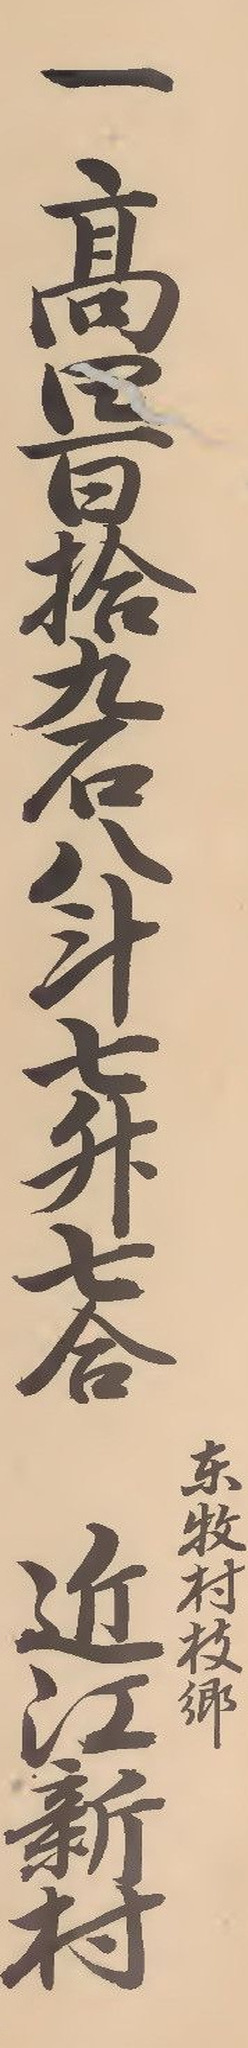一高四百拾九石八斗七升七合近江新村
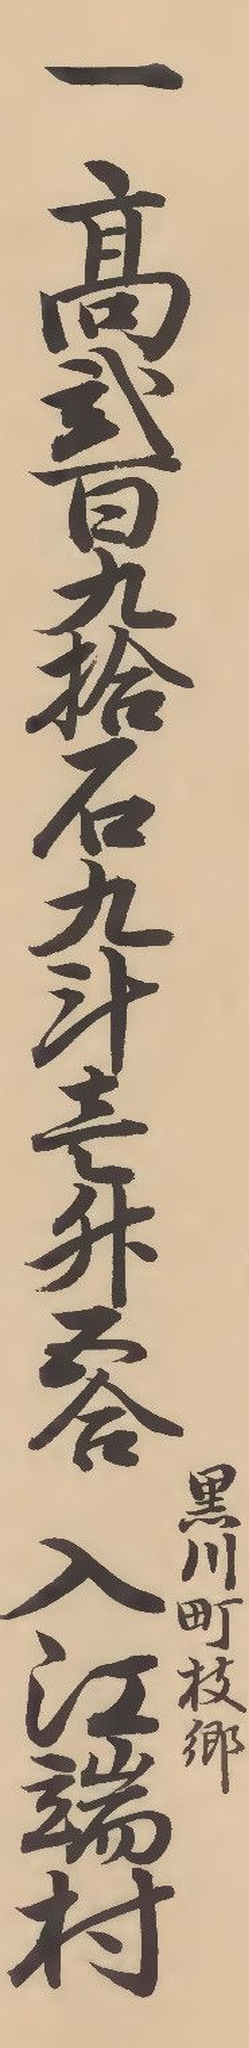一高弐百九拾石九斗壱升五合入江端村
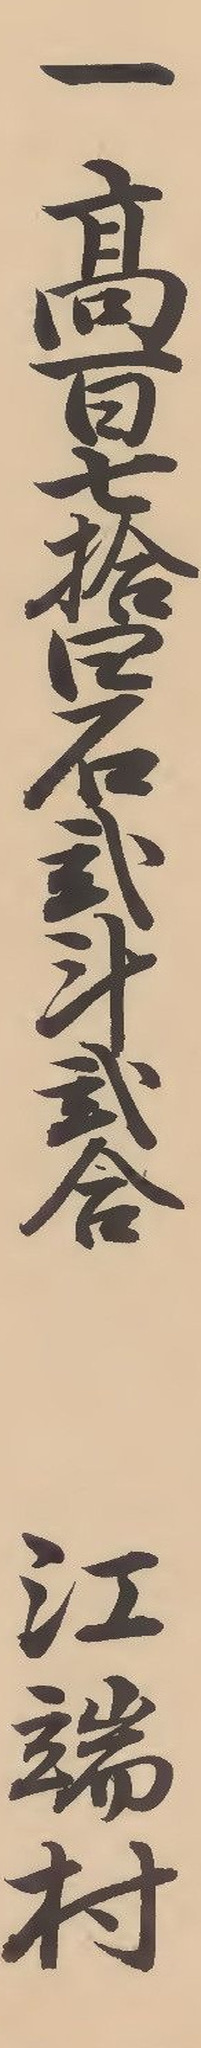一高百七拾四石弐斗弐合江端村
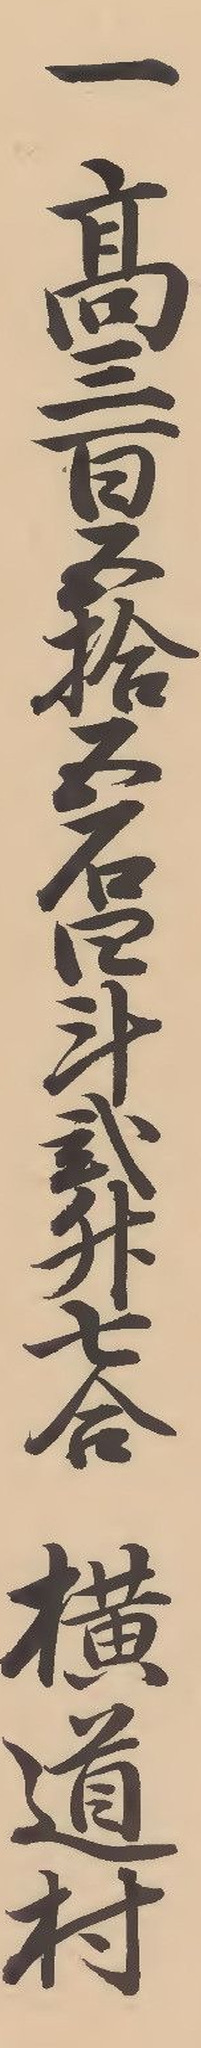一高三百五拾五石四斗弐升七合横道村

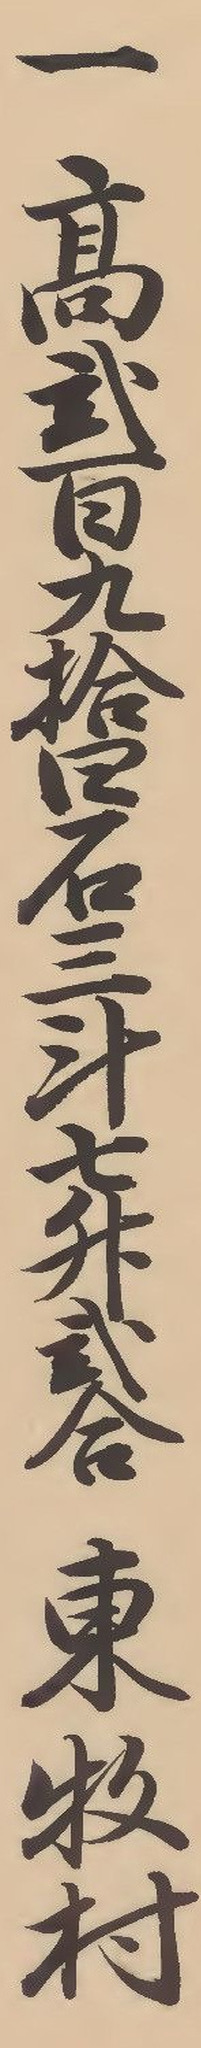一高弐百九拾四石三斗七升弐合東牧村
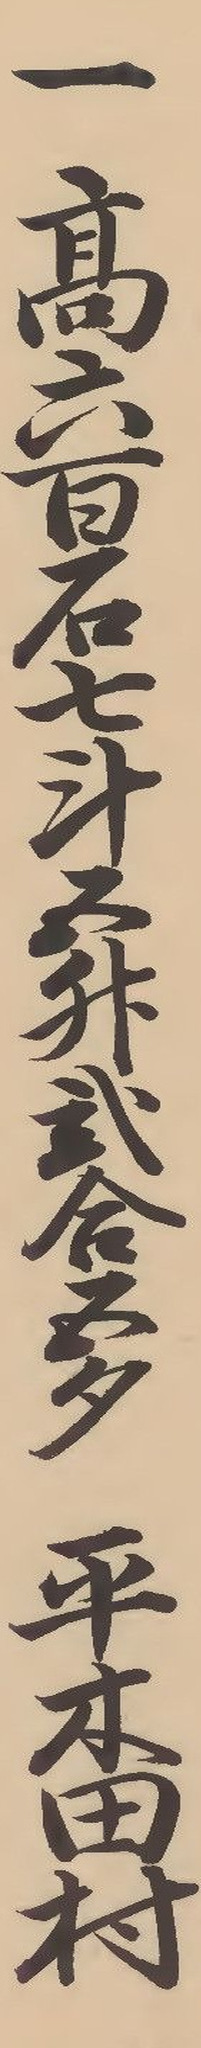一高六百石七斗五升弐合五勺平木田村
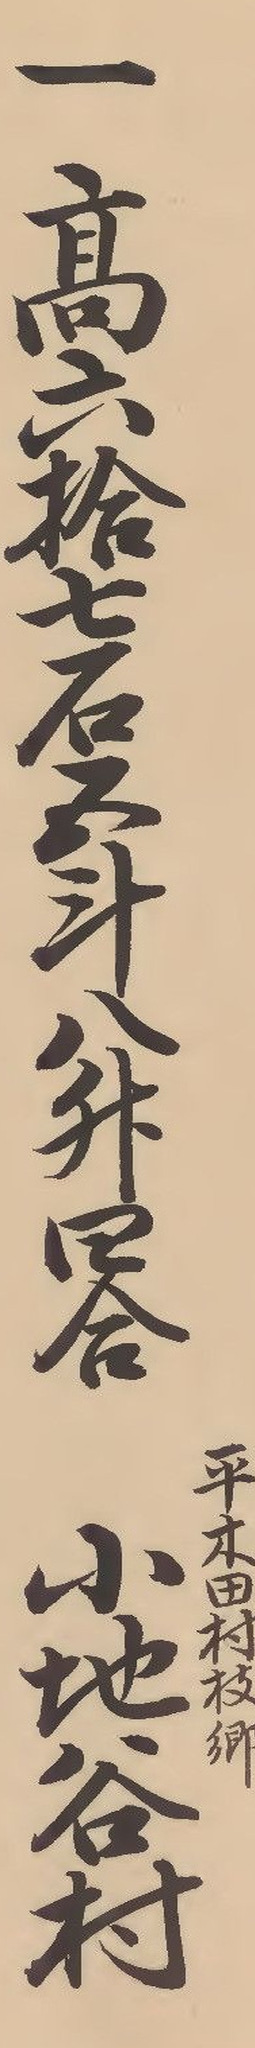一高六拾七石五斗八升四合小地谷村
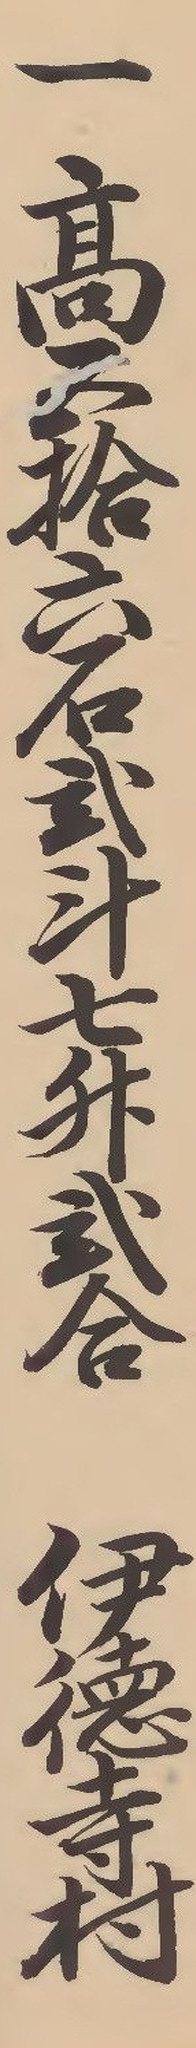一高五拾六石弐斗七升弐合伊徳寺村
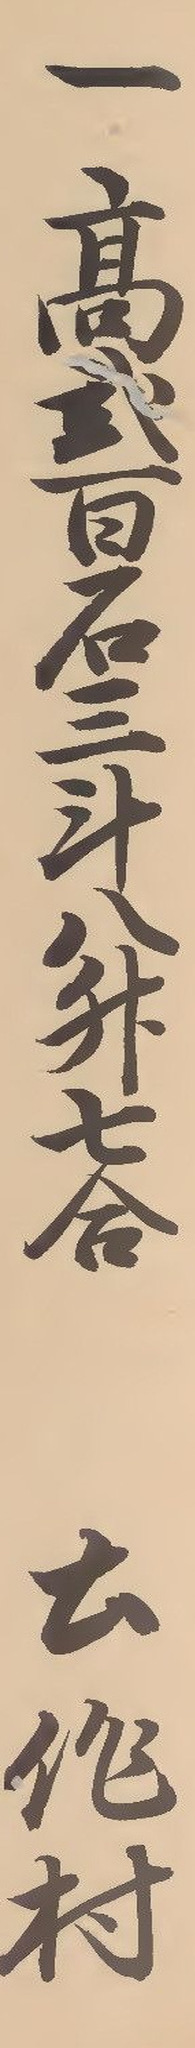一高弐百石三斗八升七合土作村
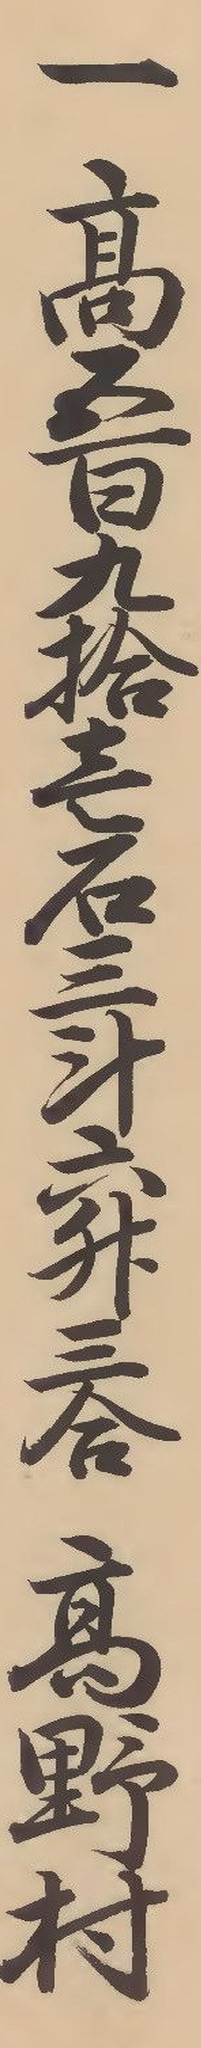一高五百九拾壱石三斗六升三合高野村
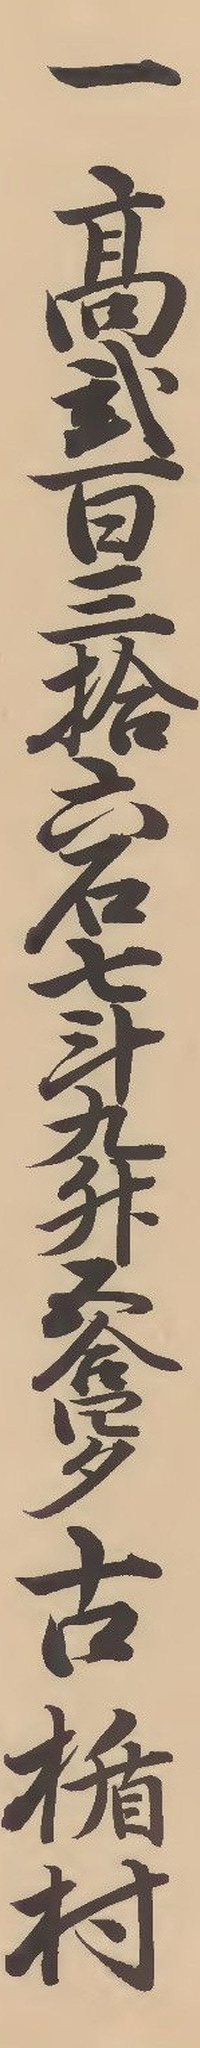一高弐百三拾六石七斗九升五合四勺古楯村
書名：越後国郷帳　下
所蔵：国立公文書館 National Archives of Japan
